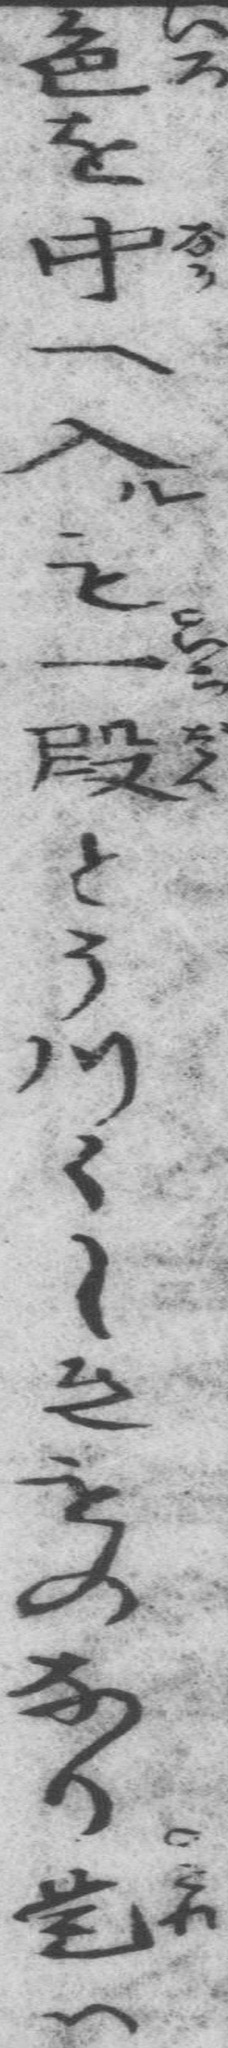色を中へ入るも。一段とうつくしきものなり。是は

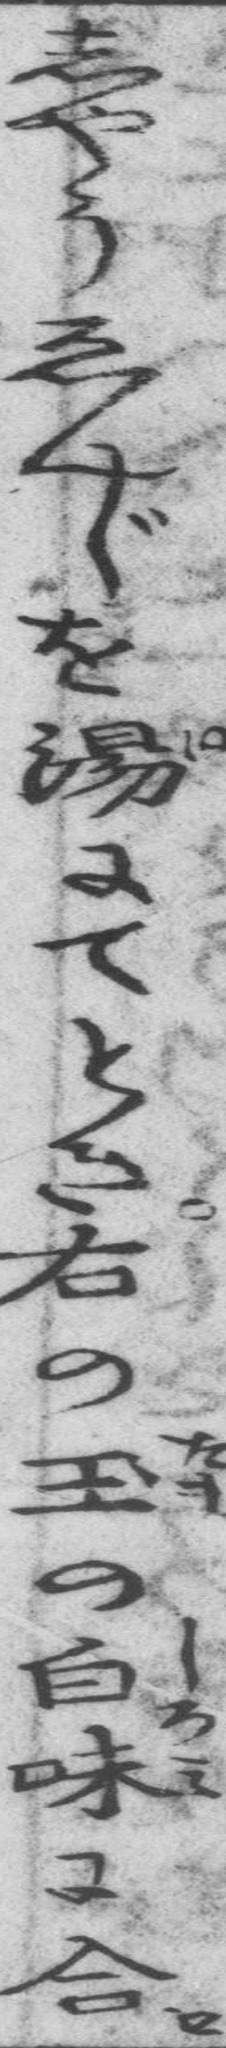しやうゑんじを湯にてとき。右の玉の白味に合せ
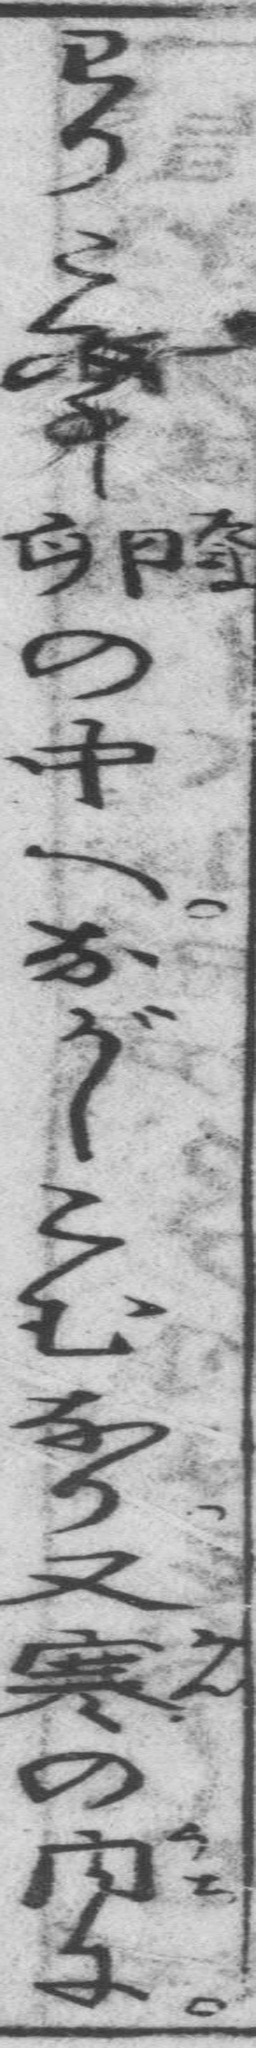わりこみし卵の中へ。ながしこむなり。又寒の内に。
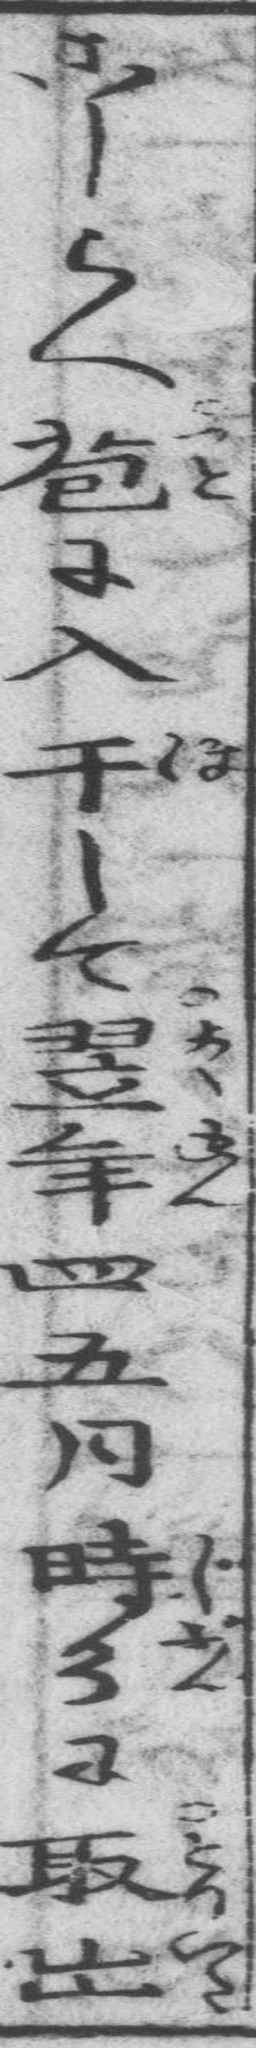こしらへ。苞に入干して。翌年四五月時分に。取出
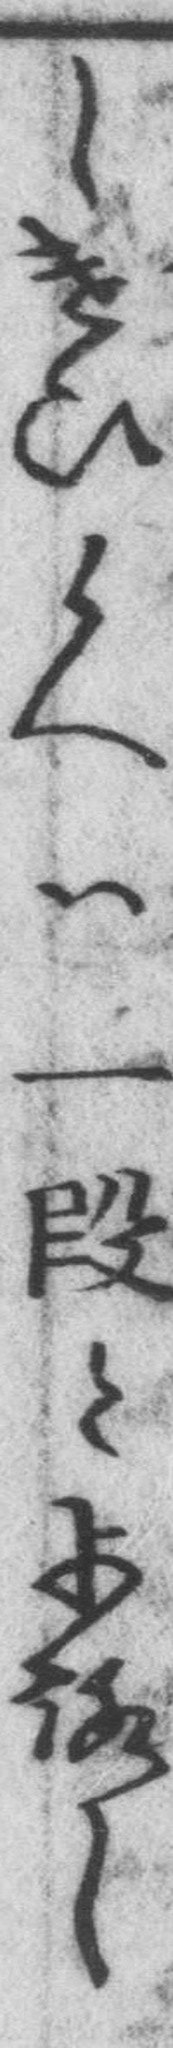し。遣ひ候へは。一段とよろし
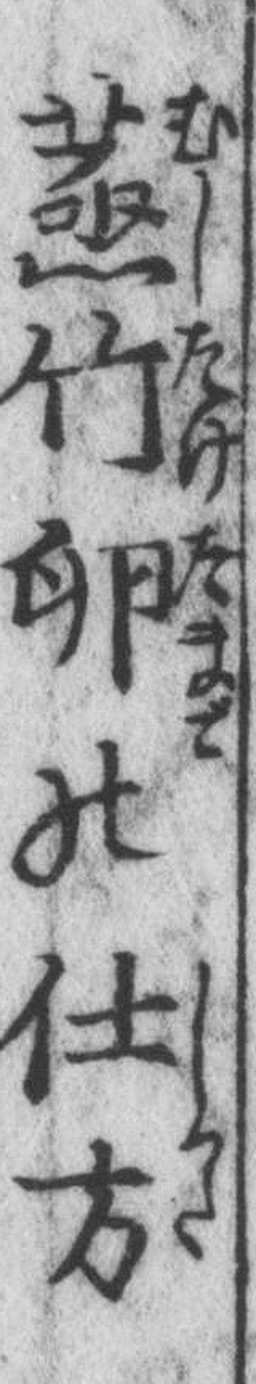蒸竹卵の仕方
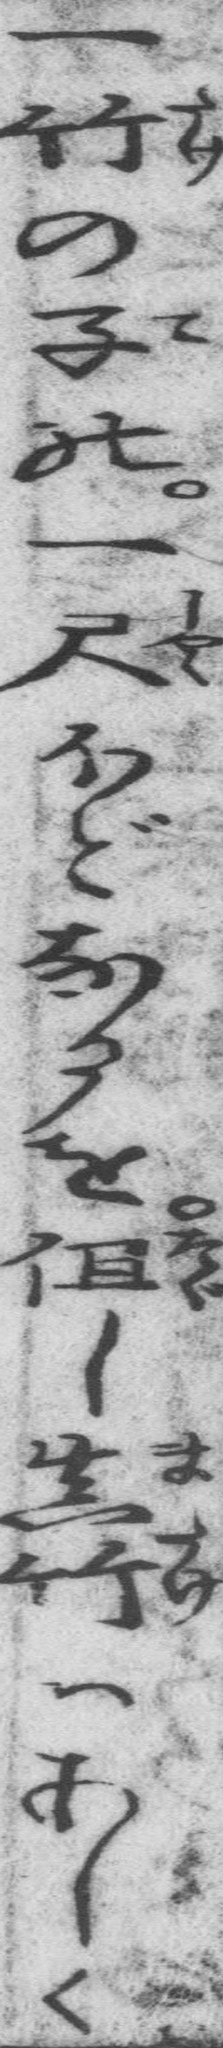一竹の子の。一尺ほどなるを。但し真竹はあしく。
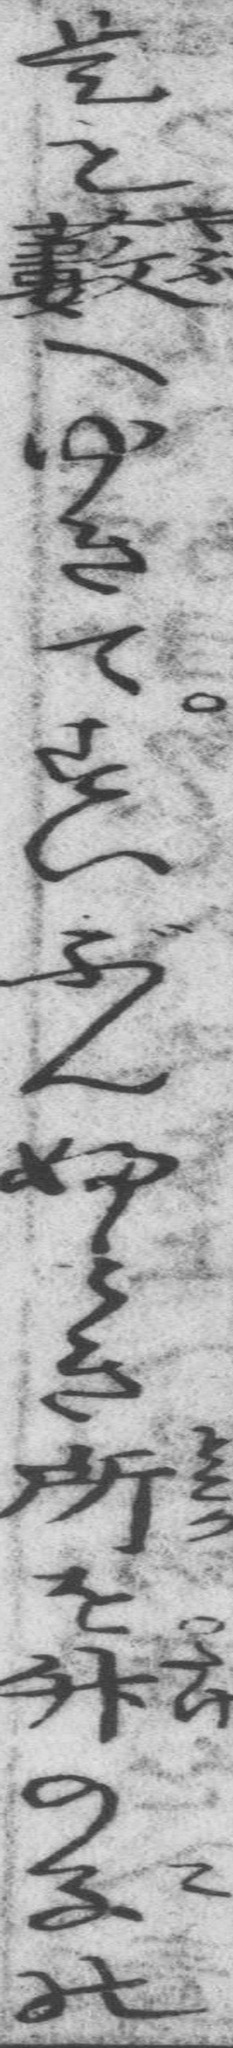是も薮へゆきて。すいぶんふとき所を。竹の子の
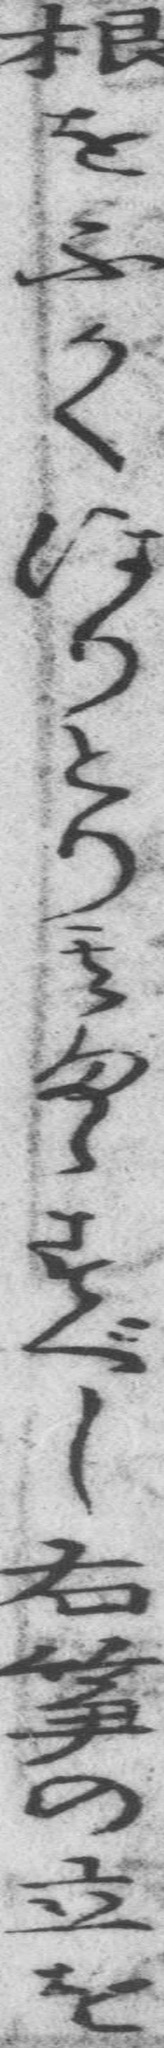根をふかく。ほりとり。其まますべし。右笋の立を
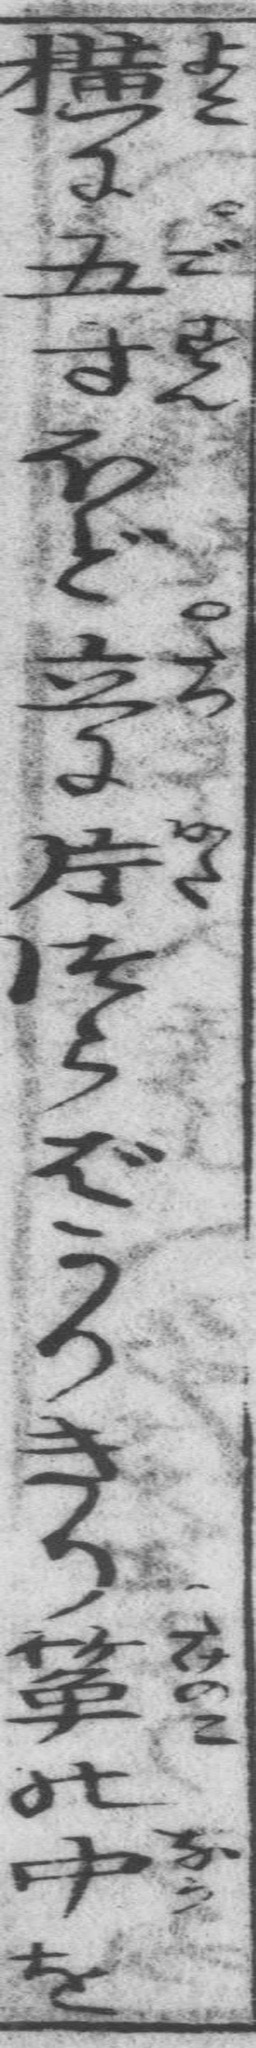横に。五寸ほど。立に片つらばかりきり。笋の中を
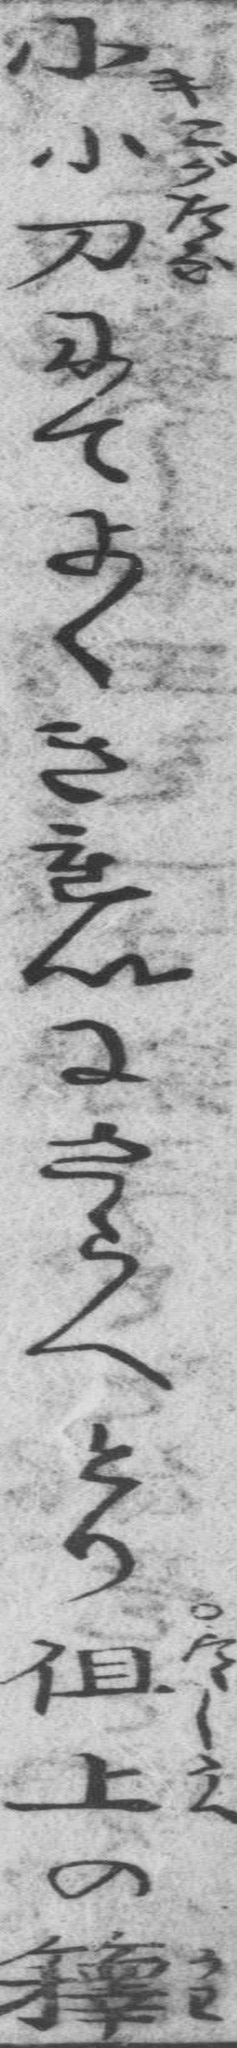小き小刀にてよくきれいにさらへとり。但上の籜
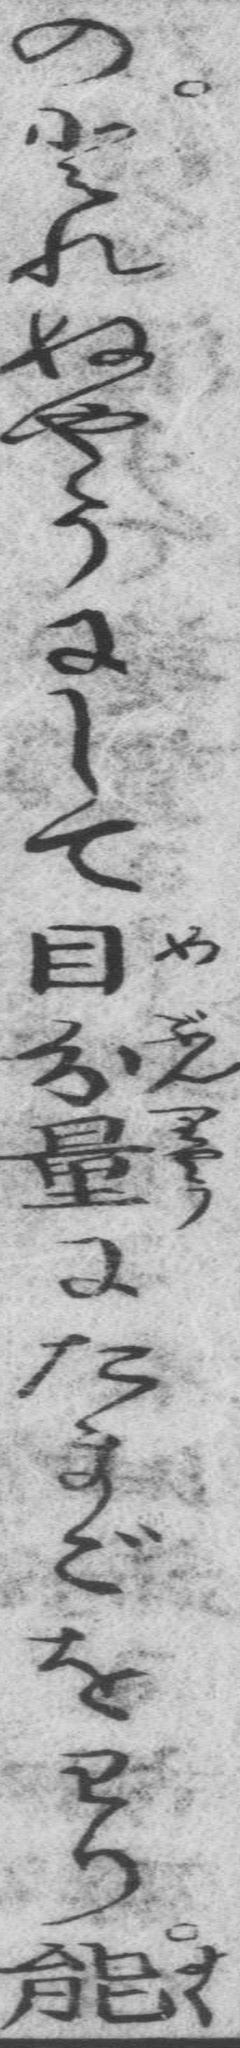の。とれぬやうにして目分量にたまごをわり。能
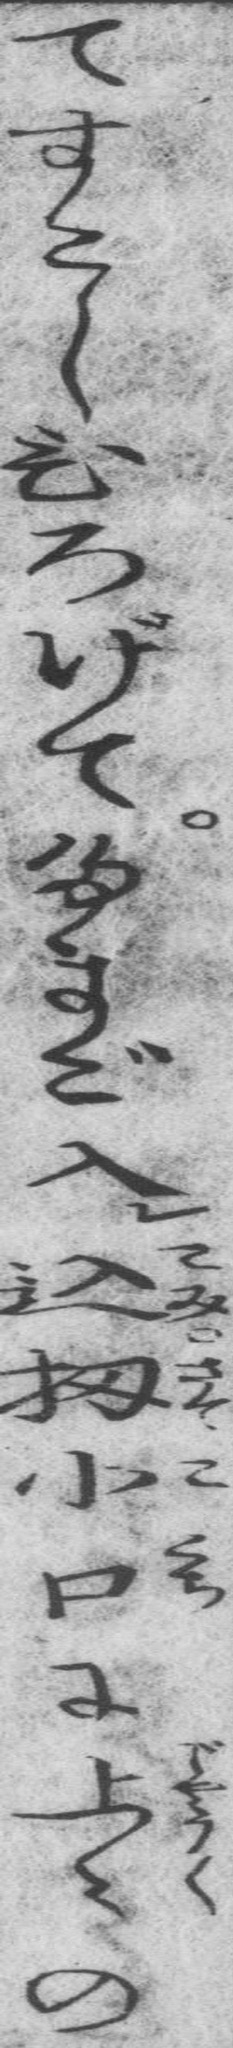てすこしひろげて。たまご入れ込。扨小口に上々の
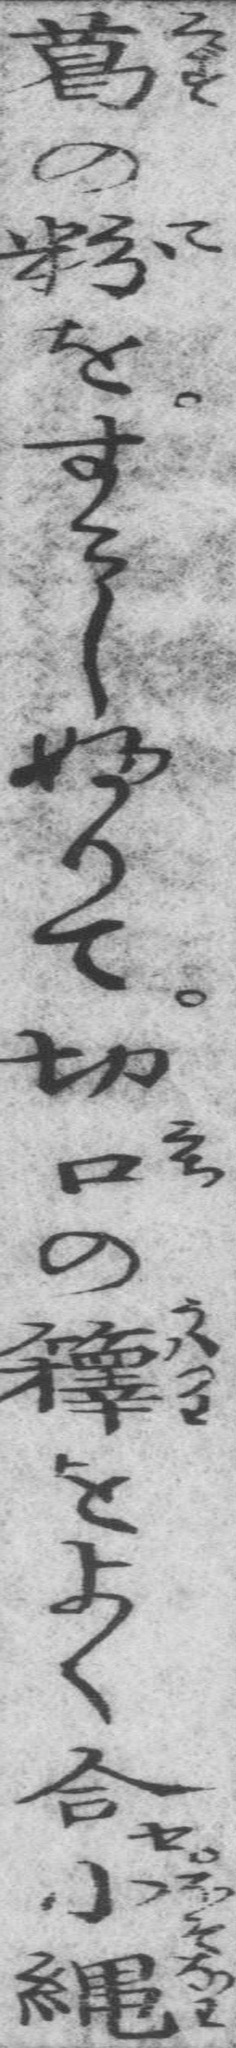葛の粉を。すこしふりて。切口の籜をよく合せ。小縄
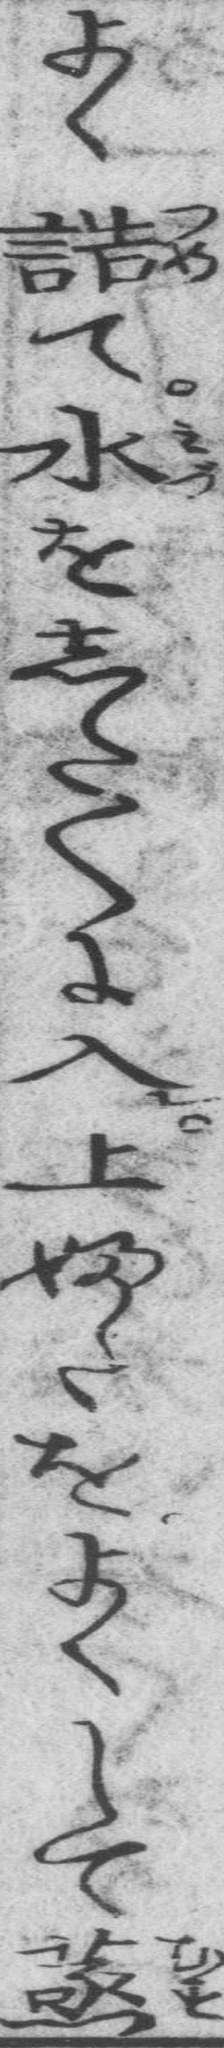よく詰て。水をした〳〵に入れ。上ふたをよくして蒸
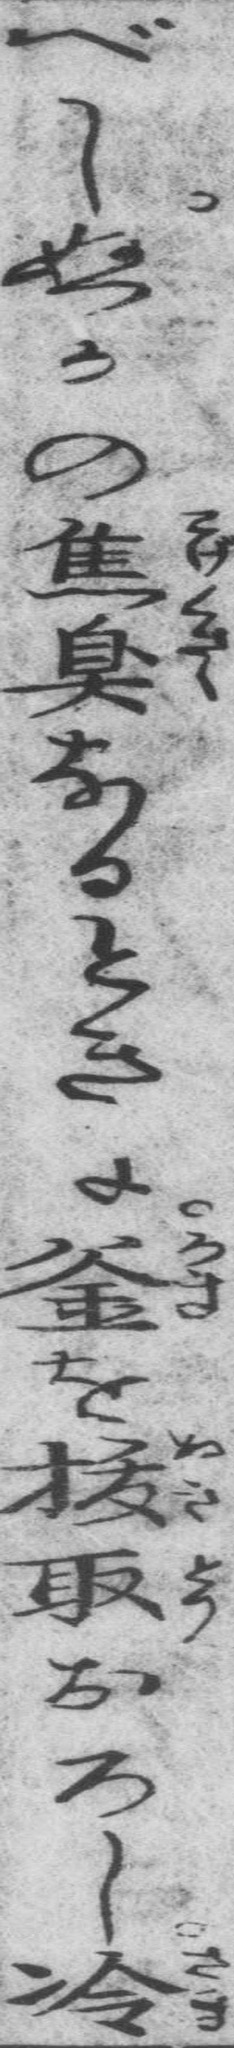べし。ぬかの焦臭なるときに。釜を抜取おろし。冷
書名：萬寳料理秘密箱
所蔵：大阪府立大学学術情報センター 国文学研究資料館
